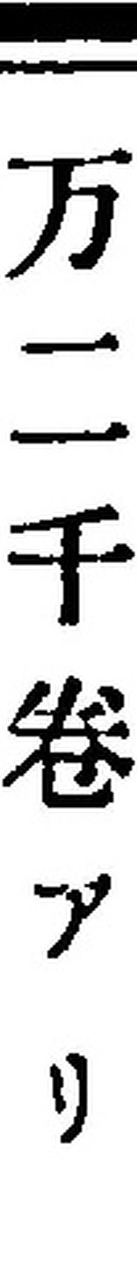万二千卷アリ
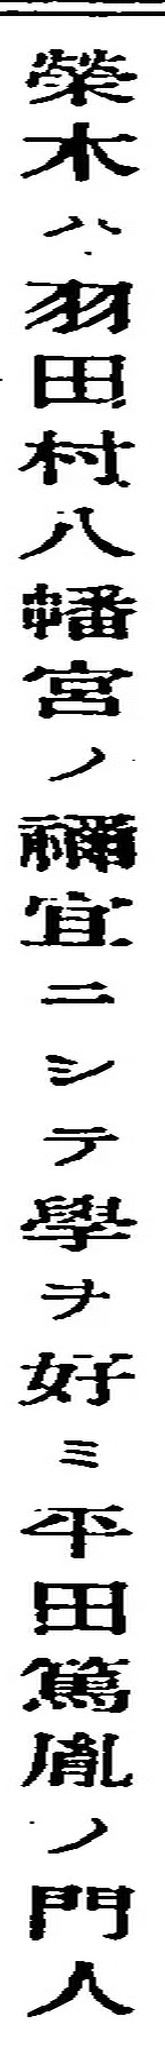羽田野榮木ハ羽田村八幡宮ノ禰宜ニシテ學ヲ好ミ平田篤胤ノ門人
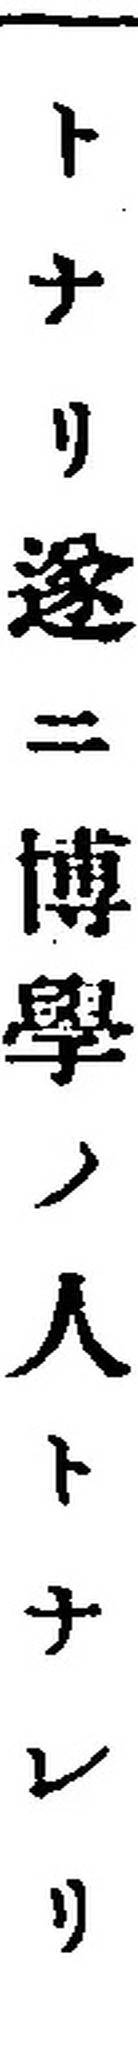榮木トナリ遂ニ博學ノ人トナレリ
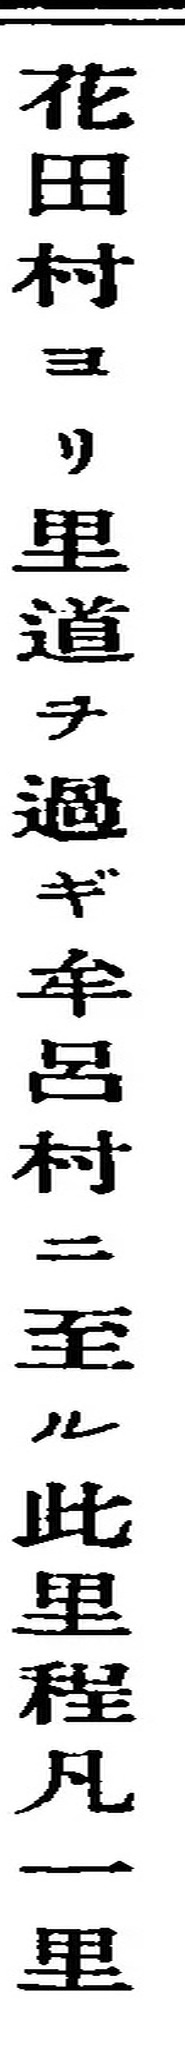牟呂村花田村ヨリ里道ヲ過ギ牟呂村ニ至ル此里程凡一里
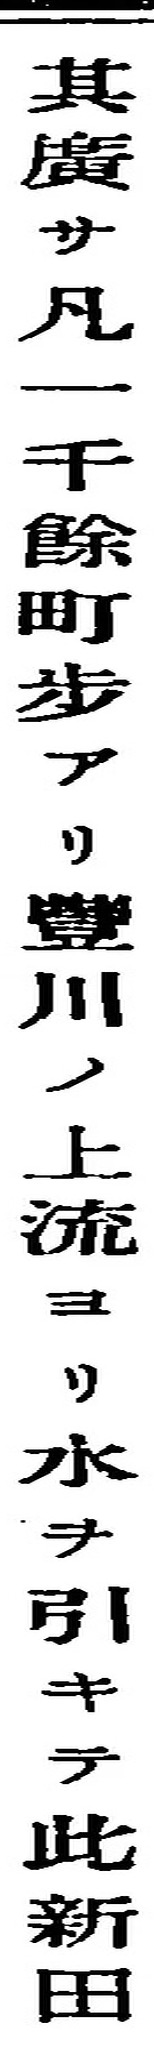其廣サ凡一千餘町歩アリ豐川ノ上流ヨリ水ヲ引キテ此新田
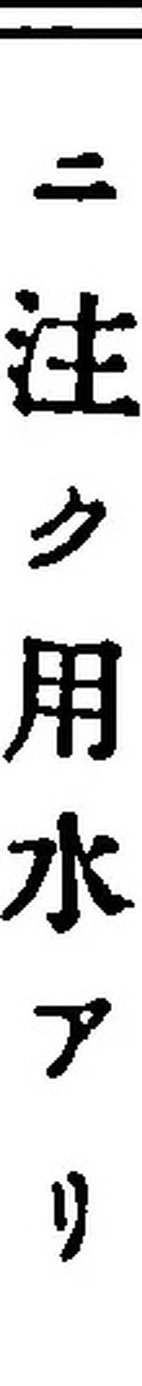ニ注ク用水アリ
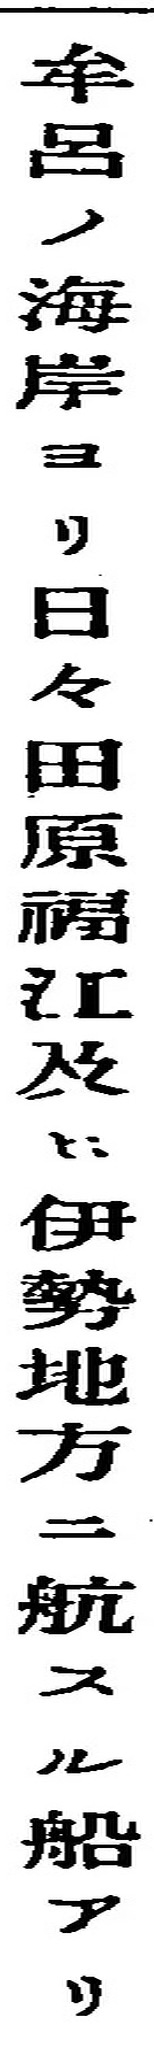牟呂ノ海岸ヨリ日々田原福江及ヒ伊勢地方ニ航スル船アリ
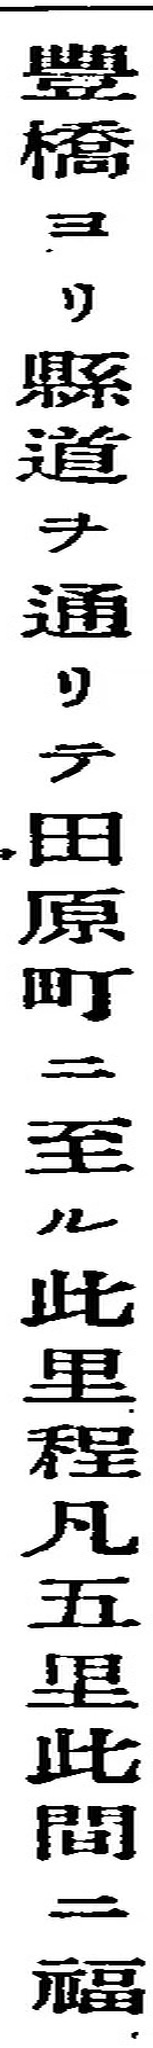福岡村豐橋ヨリ縣道ヲ通リテ田原町ニ至ル此里程凡五里此間ニ福
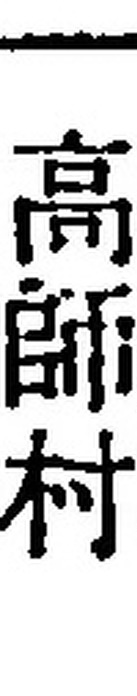高師村
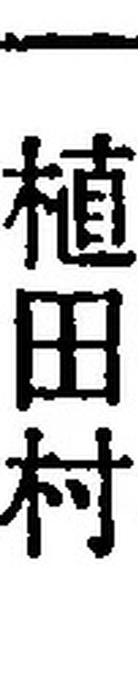植田村
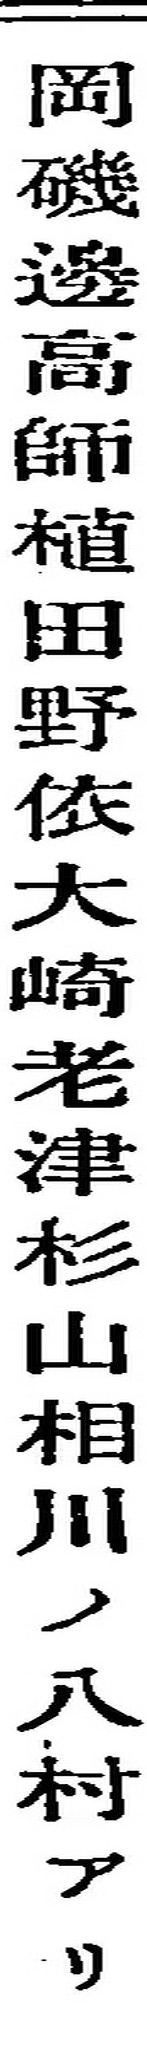磯邊村岡磯邊高師植田野依大崎老津杉山相川ノ八村アリ
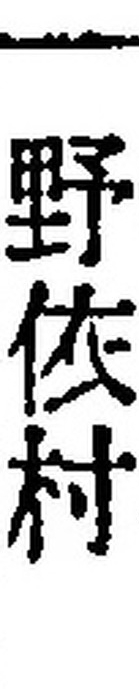野依村
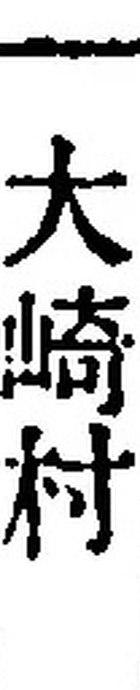大崎村
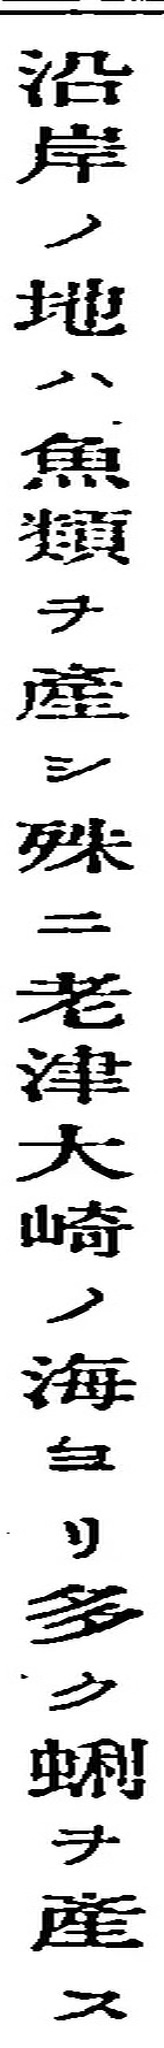產物沿岸ノ地ハ魚類ヲ產シ殊ニ老津大崎ノ海ヨリ多ク蜊ヲ產ス
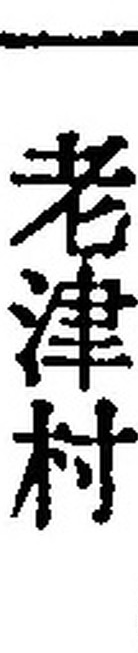老津村
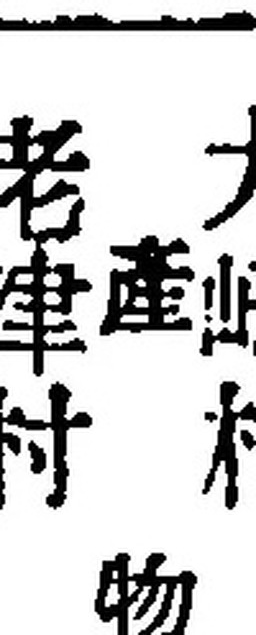老津村
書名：郷土誌
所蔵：国立国会図書館 National Diet Library, JAPAN
